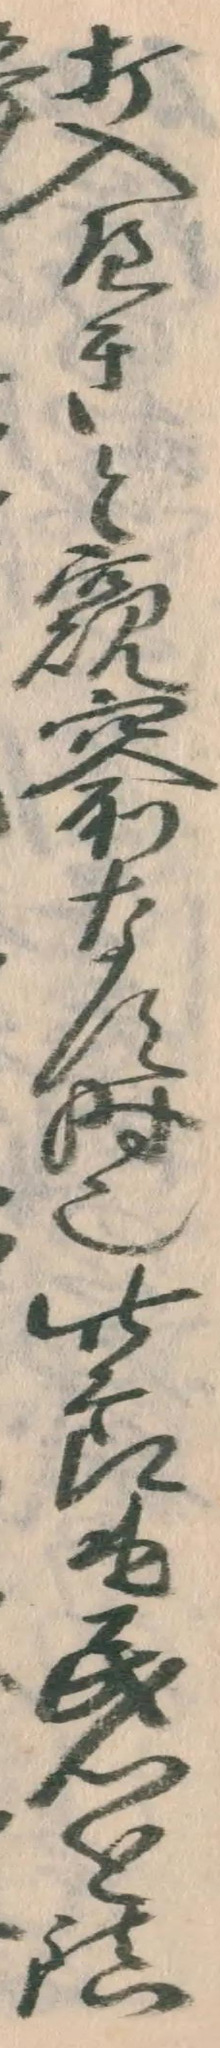打入へきと窺窬なす時也此節は民心を鎮
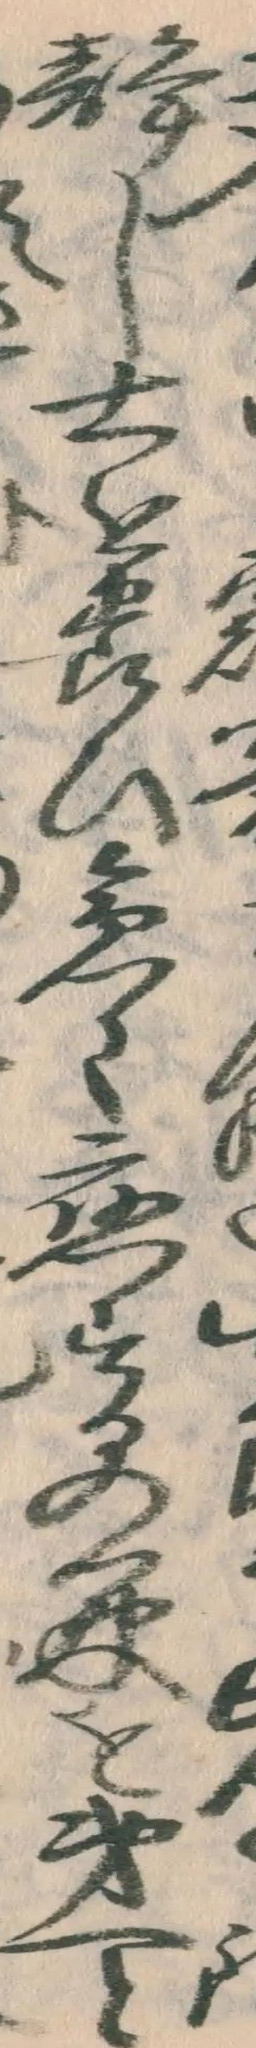静し士を養ひ急々應するの策を第一と
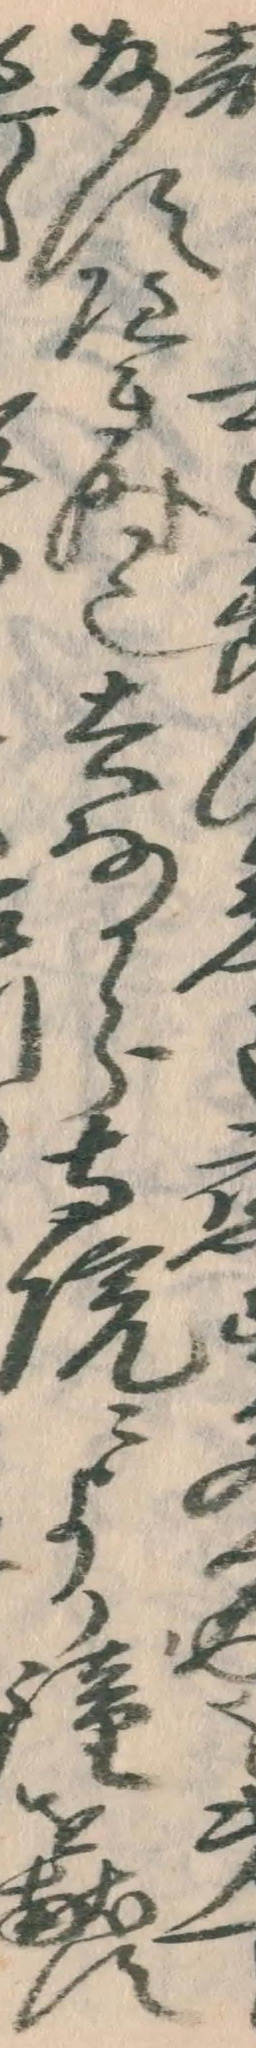なすへき時也去なから寺院ニより鐘を献す
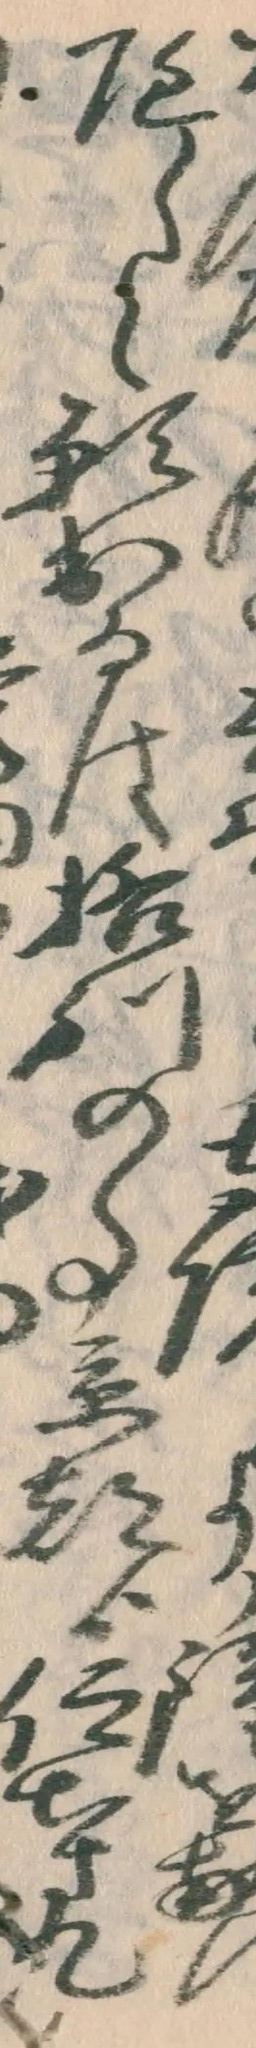へしと願出るは格別の事京都ゟ仰出され
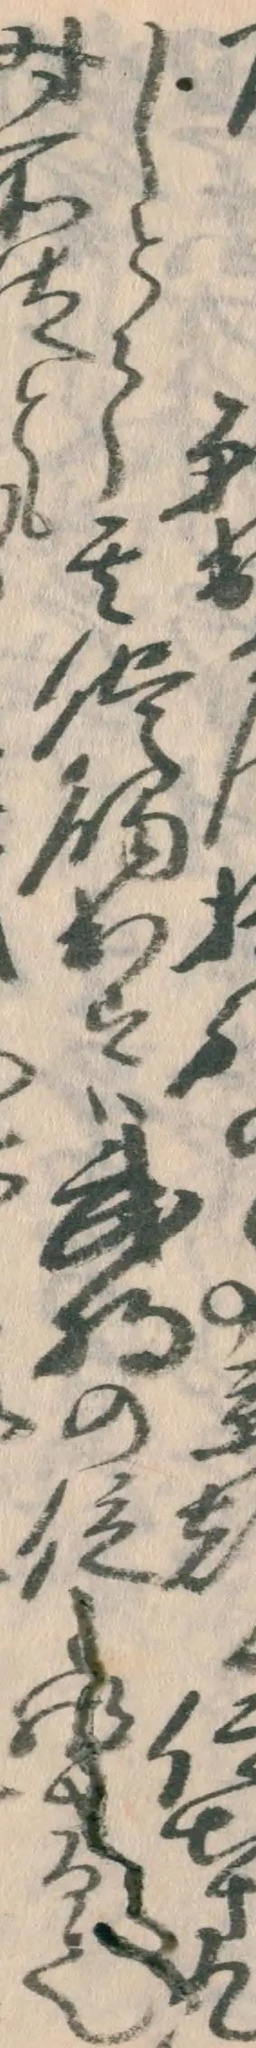しとて其儘触出すハ武将の位に然さる也
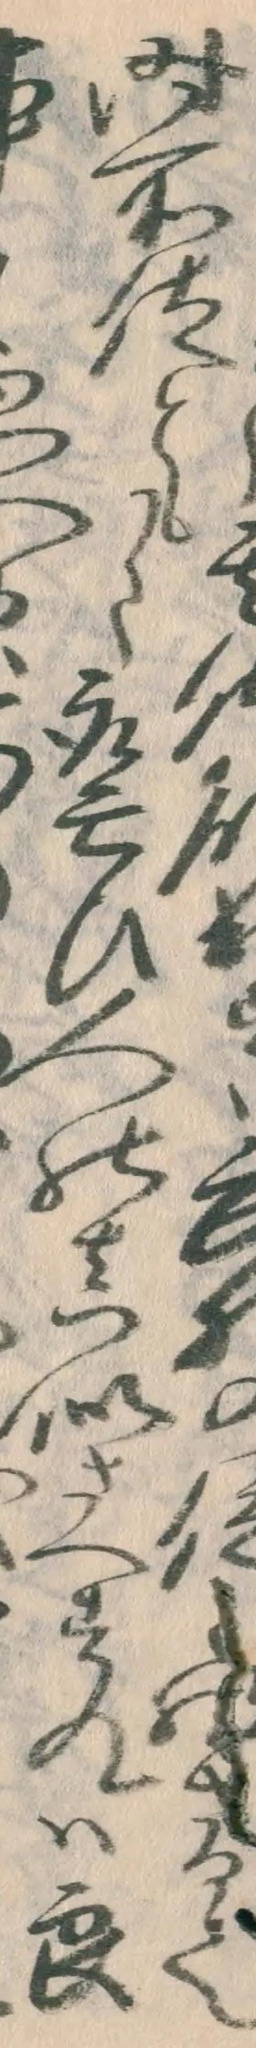時所位ともに取亡ひ人の真似さへすれハ良
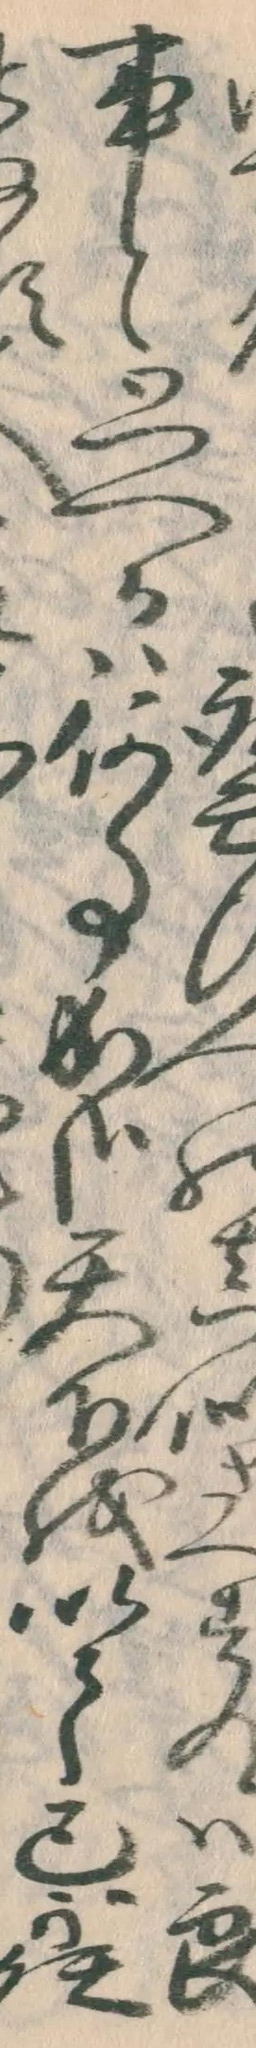事と思へるハ何事成哉天下を以て己か任
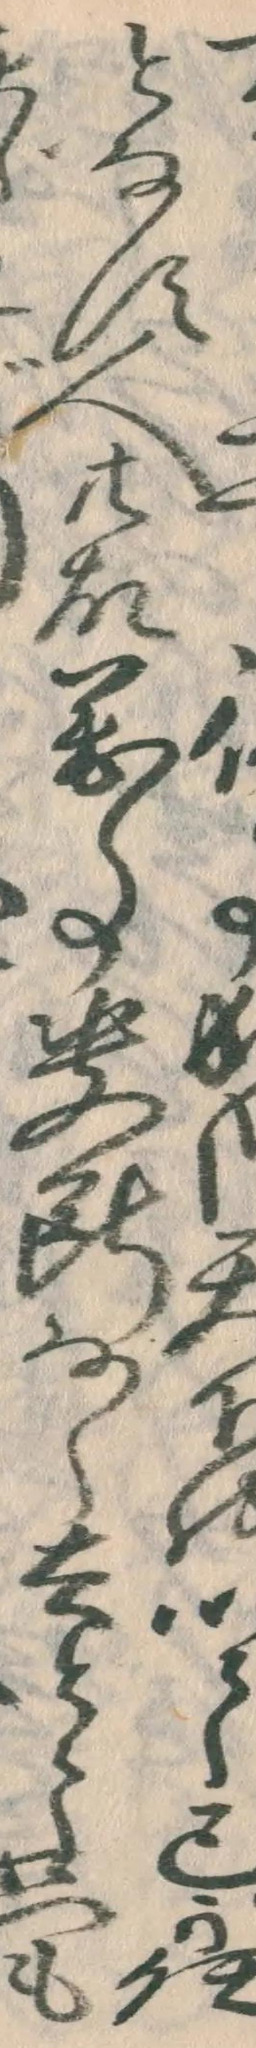となす人共故萬事決断なし去とて只も
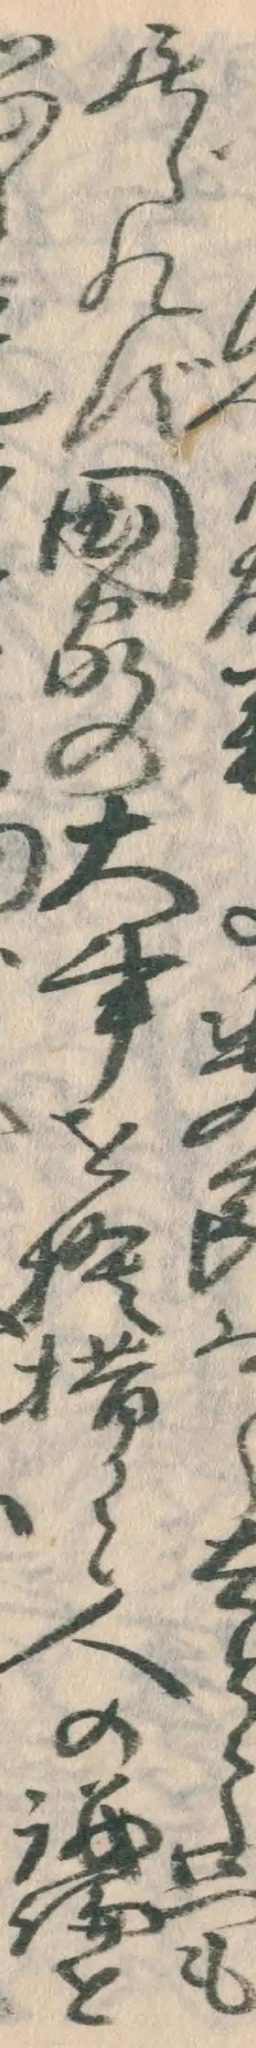居られず国家の大事を捨措にし人の議論を
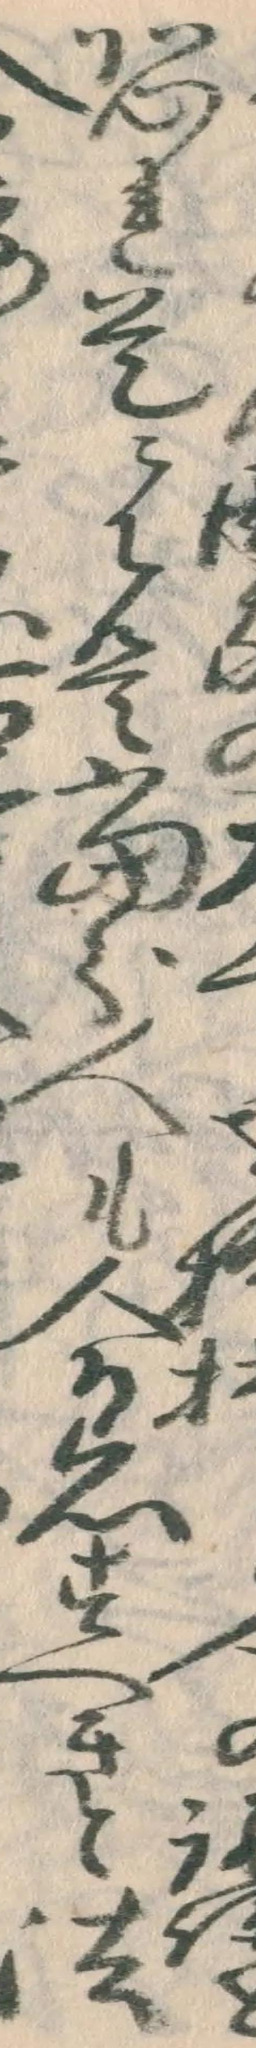恐れ是ニては當分人も合意すへきと法
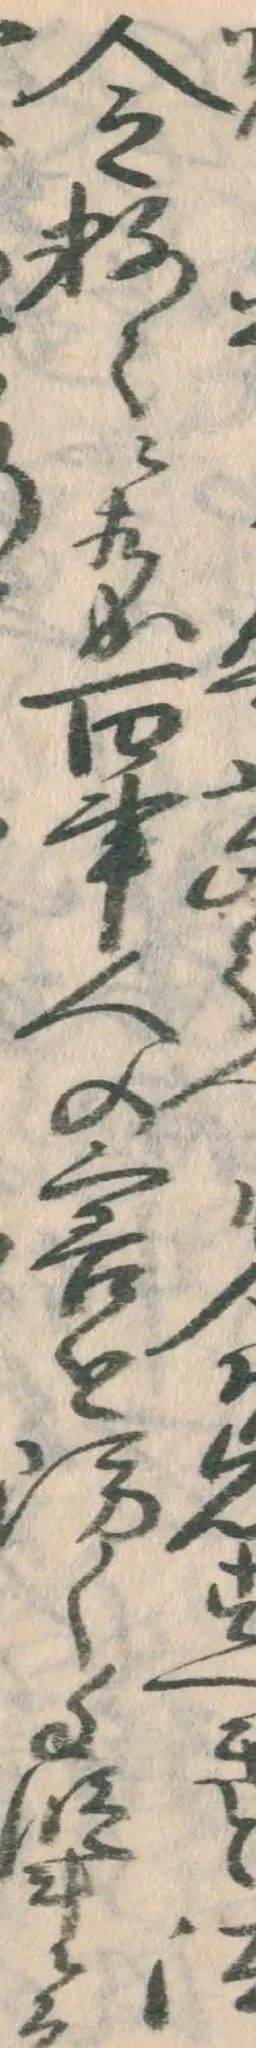令数々ニ相成百事人の害を防く手段斗二而
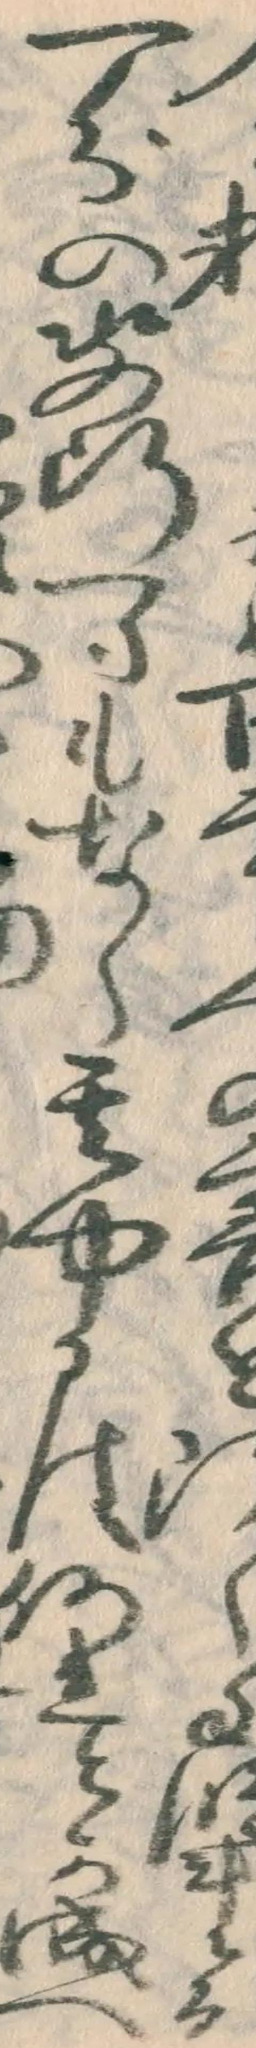一分の決断一ツもなく其中には何れとか成へ
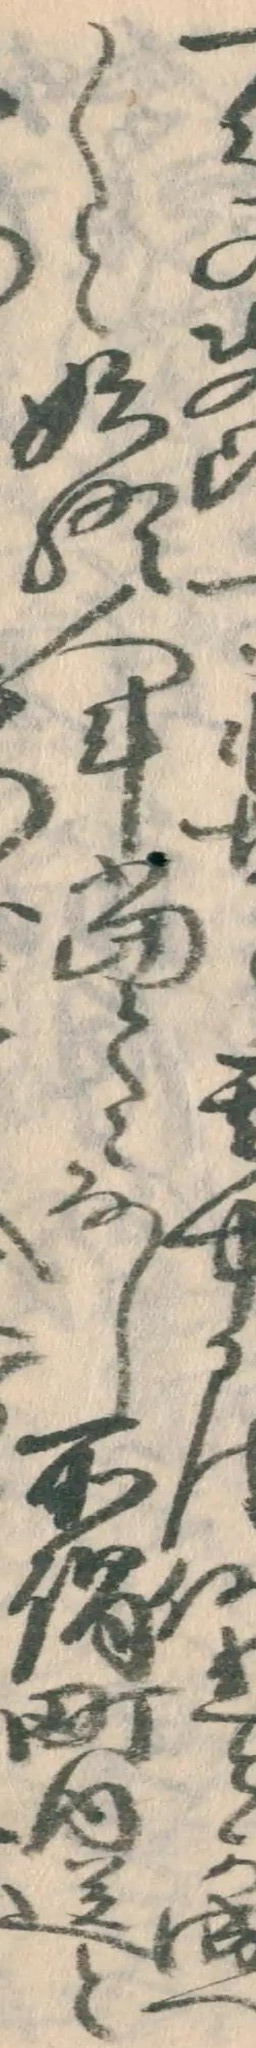しと始終人斗當てニなし所謂町内送と
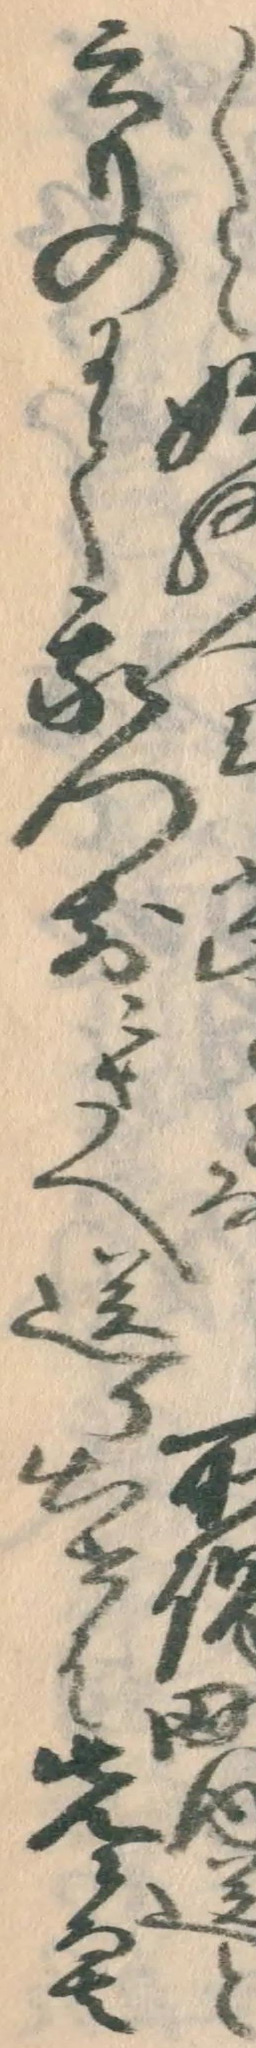云もの有て我門前ニさへ送り出せは先ニ而者

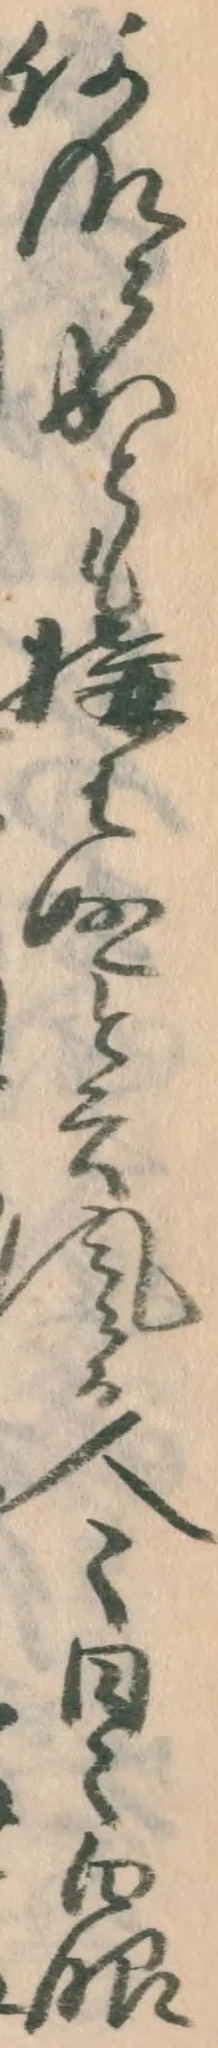何様ニ成とも構はぬと云風ニ而人々日々白眼
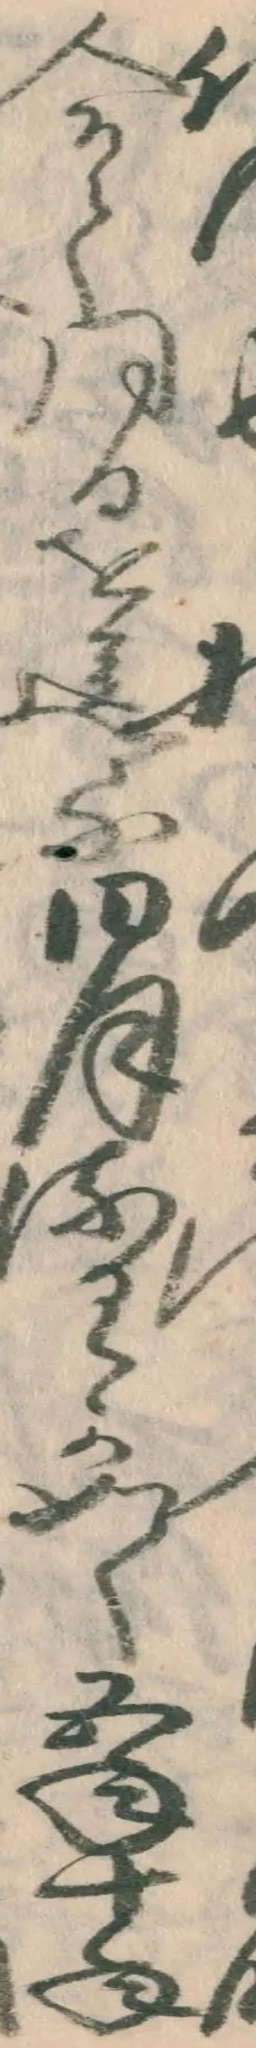合て月日を送る日月流るヽか如く五年十年
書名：麗斎叢書. 20
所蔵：国立国会図書館 National Diet Library, JAPAN
